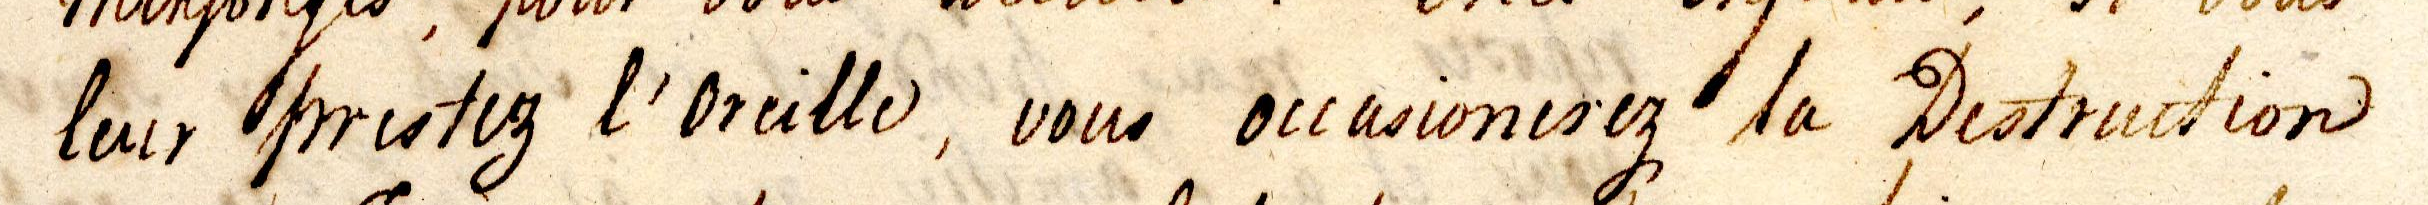leur prestez l'Oreille, vous occasionerez la Destruction
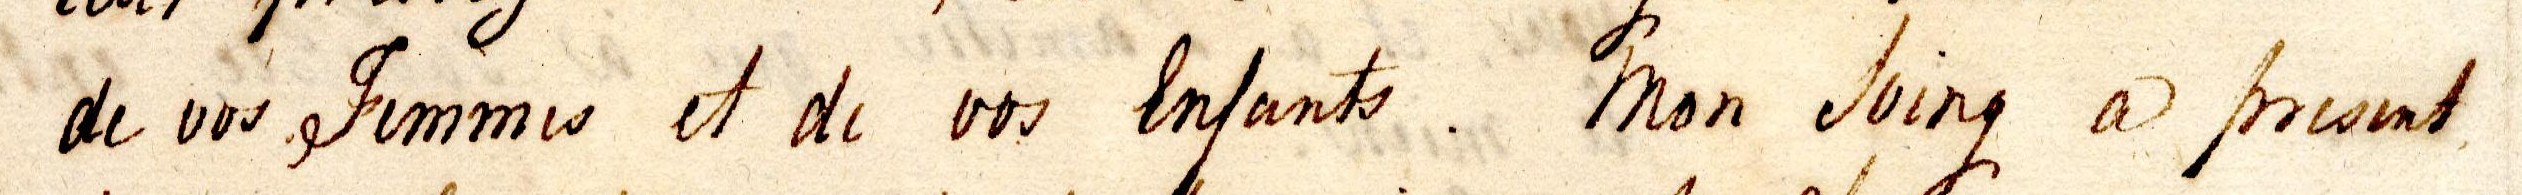de vos Femmes et de vos Enfants. Mon Soing a present
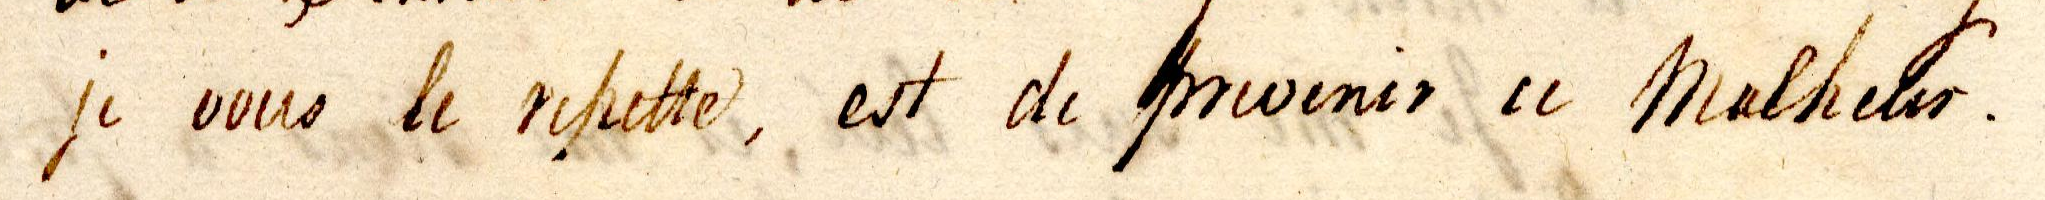je vous le repette, est de prevenir ce Malheur.
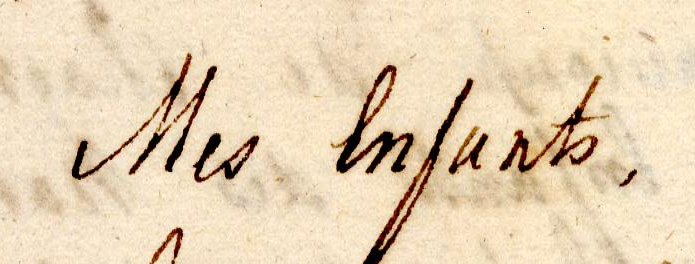Mes Enfants,
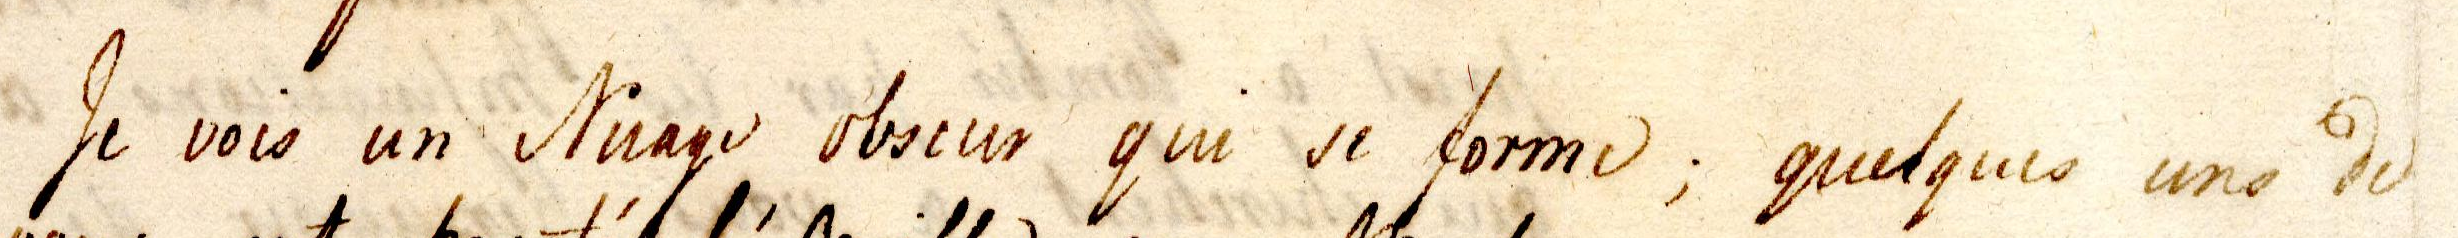Je vois un Visage obscure qui se forme; quelques une de
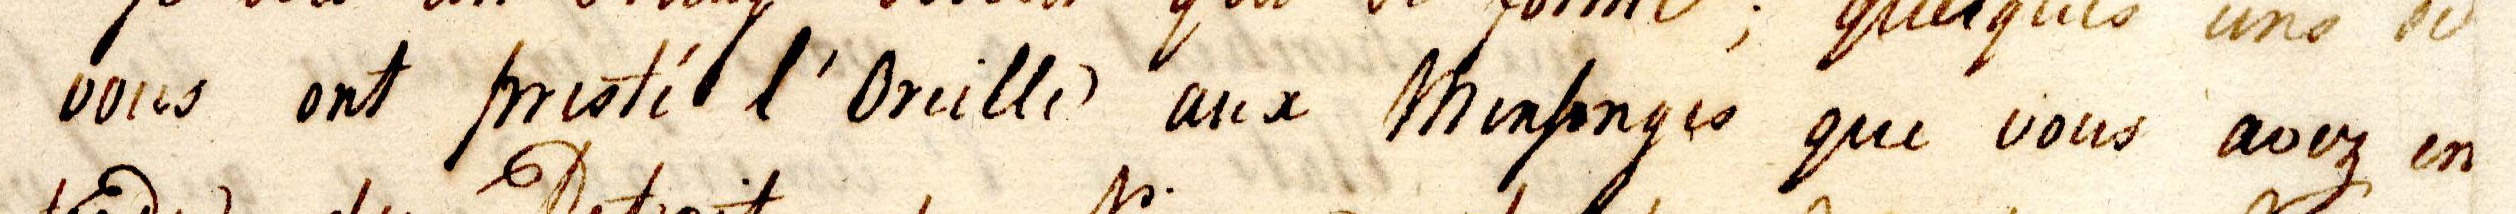vous ont presté l'oreille aux Mensonge que vous avez en-
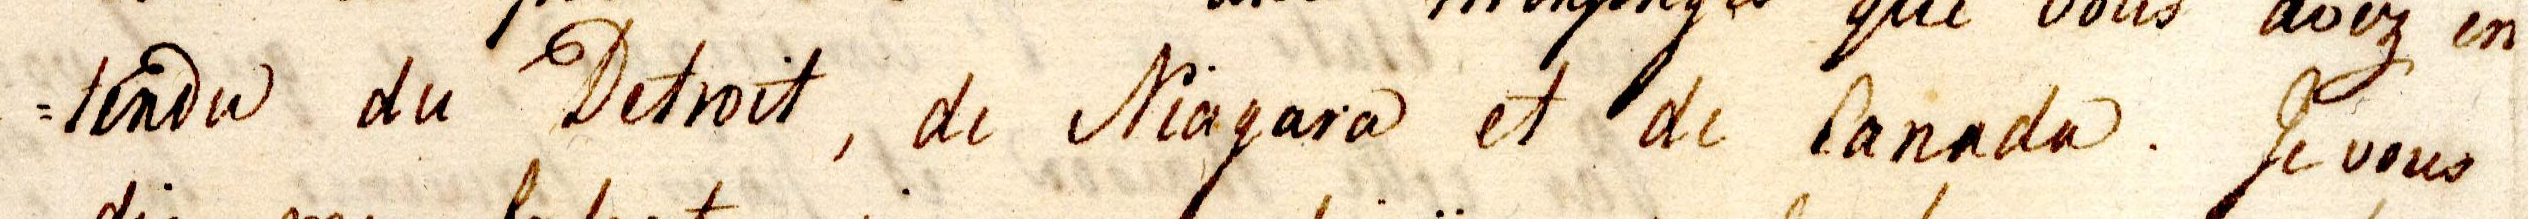-tendu du Detroit, de Niagara, et de Canada. Je vous
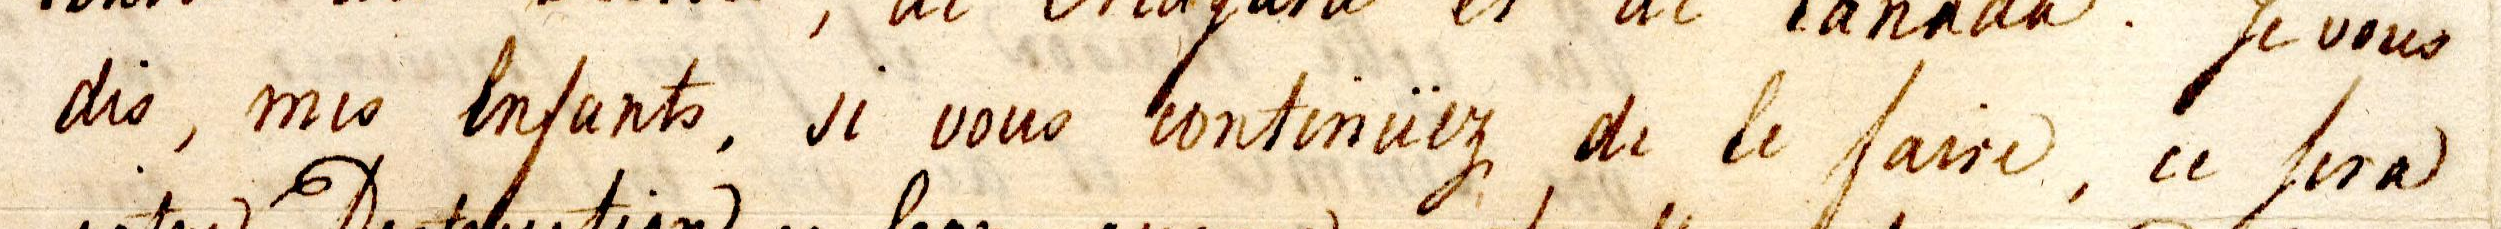dis, mes Enfants, si vous continüez de le faire, ce sera
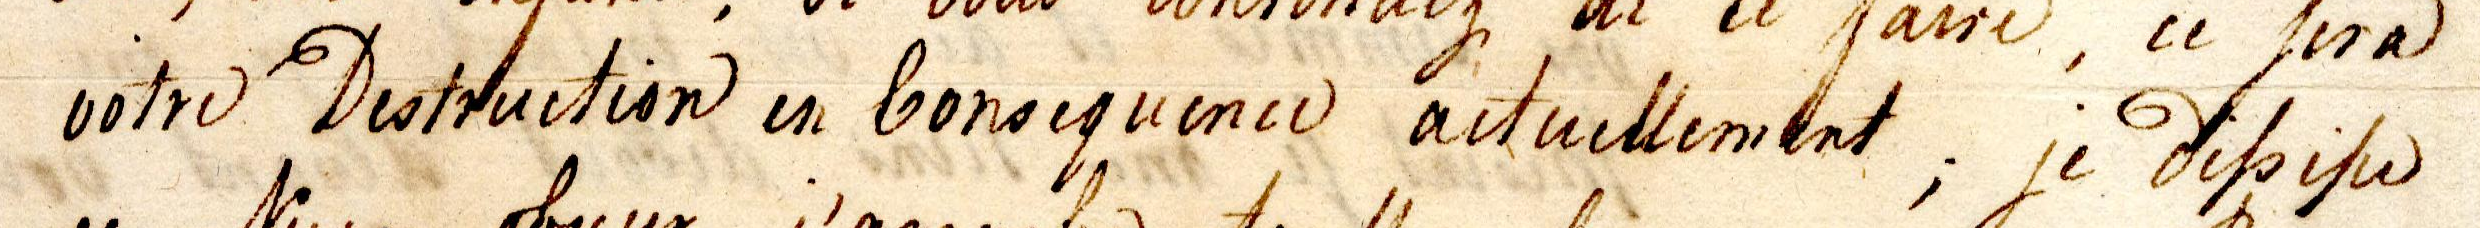votre Destruction en Consequence actuellement; je depisse
